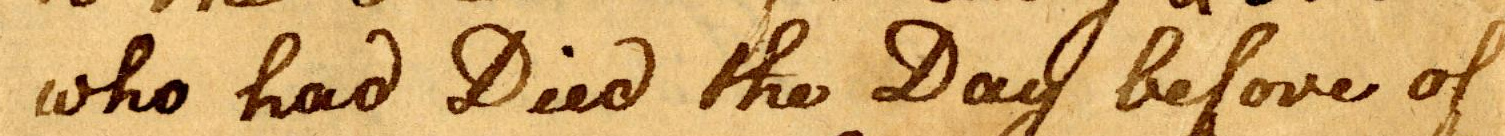who had Died the Day before of
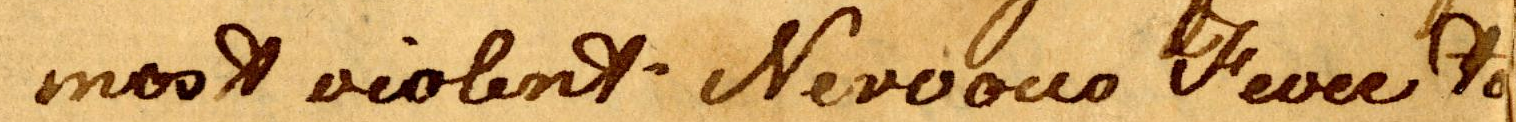most violent Nervous Fever to
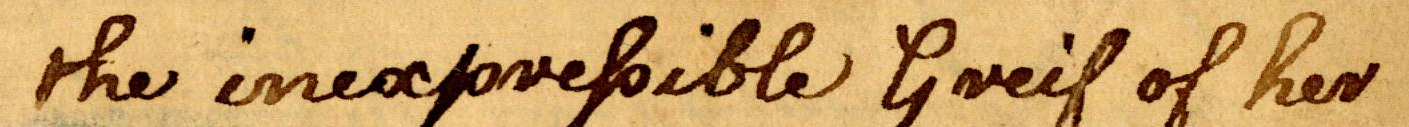the inexpressible Greif of her
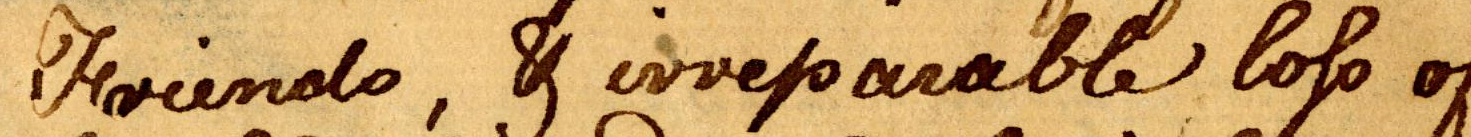Friends, & irreparable loss of
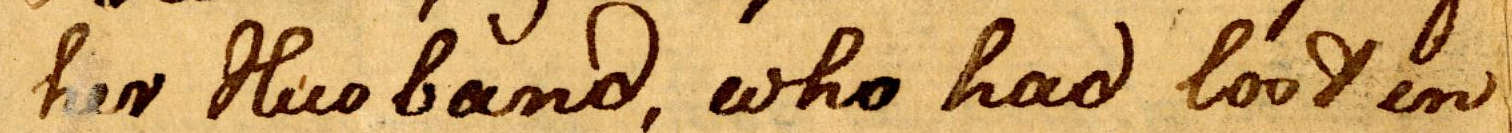her Husband, who had lost in
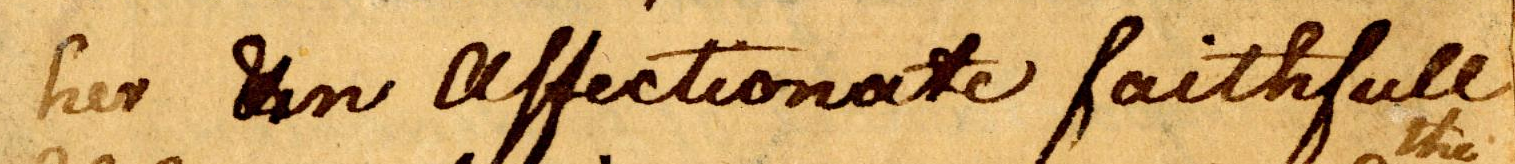her &in Affectionate faithfull
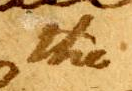the
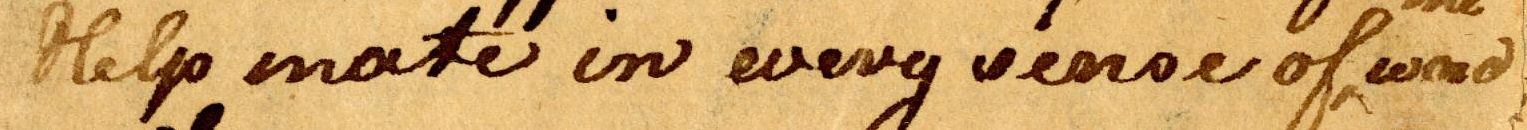Help mate in every sense of ^ word
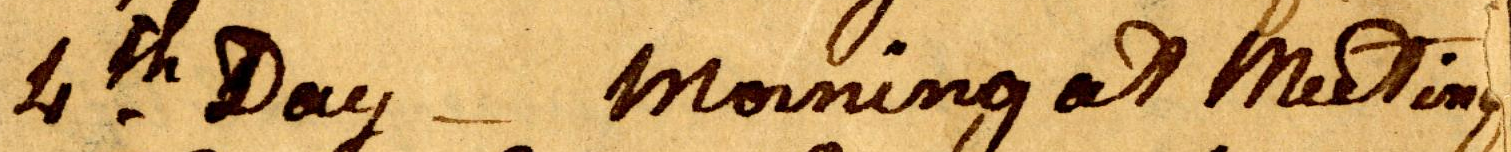4^th Day - Morning at Meeting
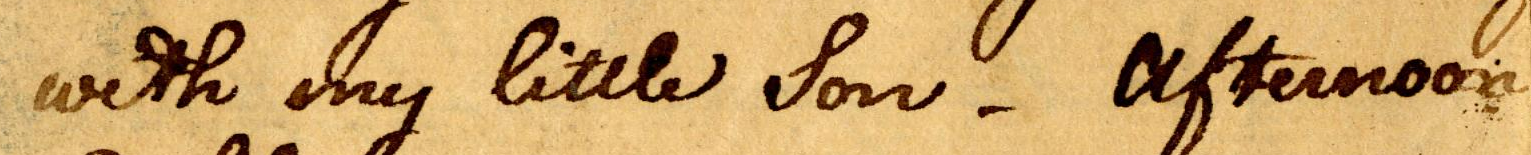with my little Son - Afternoon
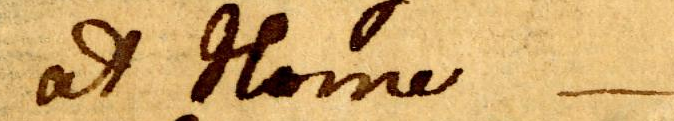at Home-
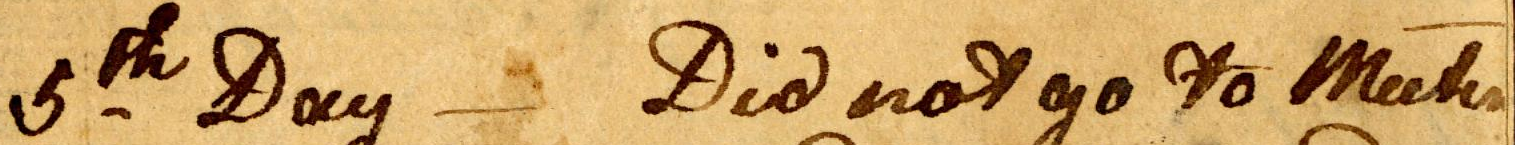5^th Day- Did not go to Meetin
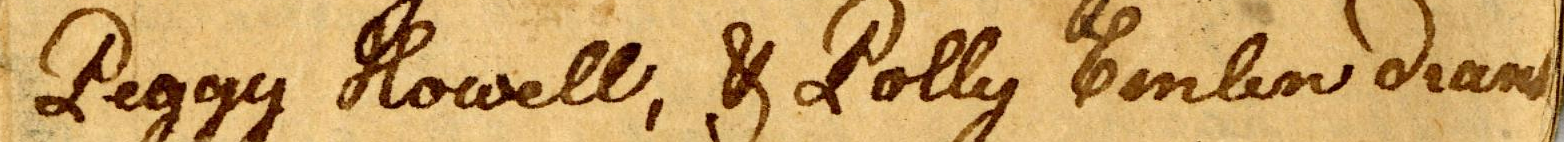Peggy Howell, & Polly Emlen drank
